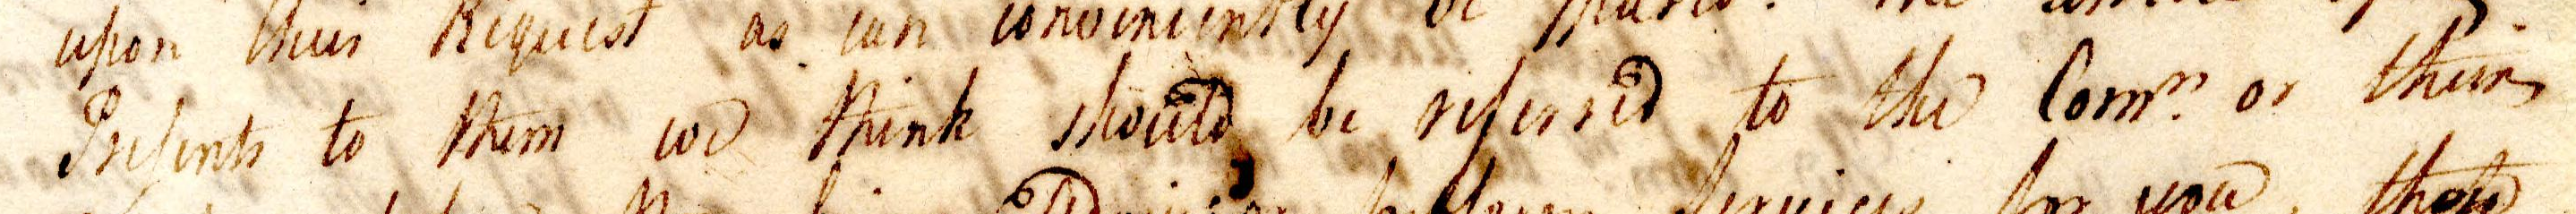Presents to them we think should be referred to the Com^r. or their
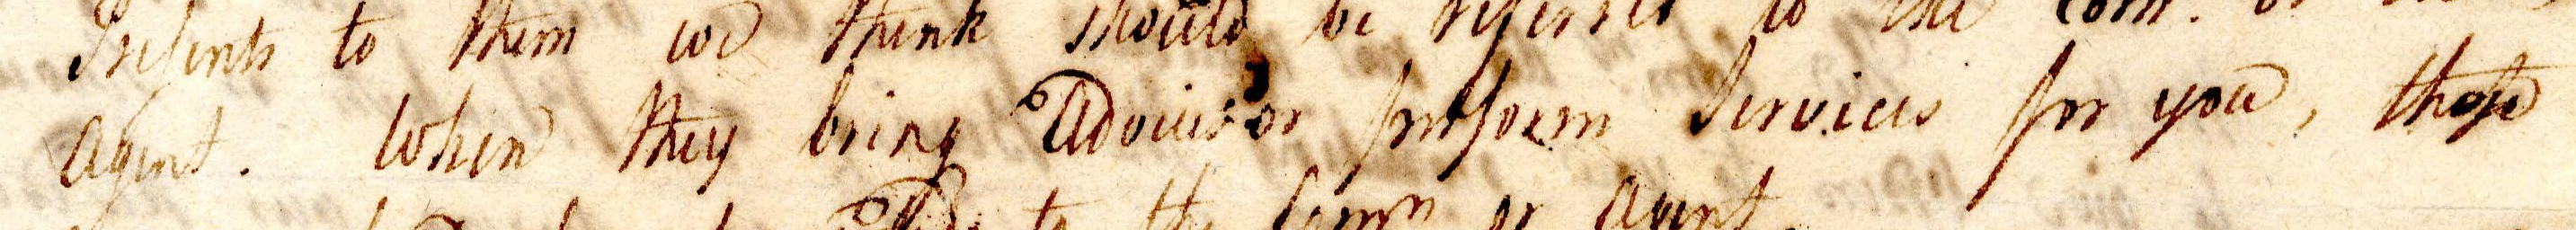Agent. When they bring Advice or perform Services for you, those
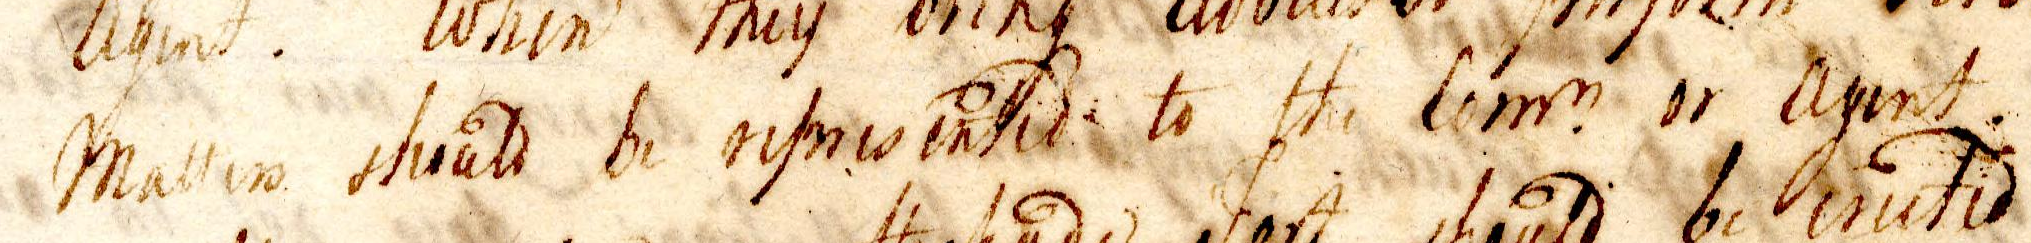Matters should be represented to the Com^r. or Agent.
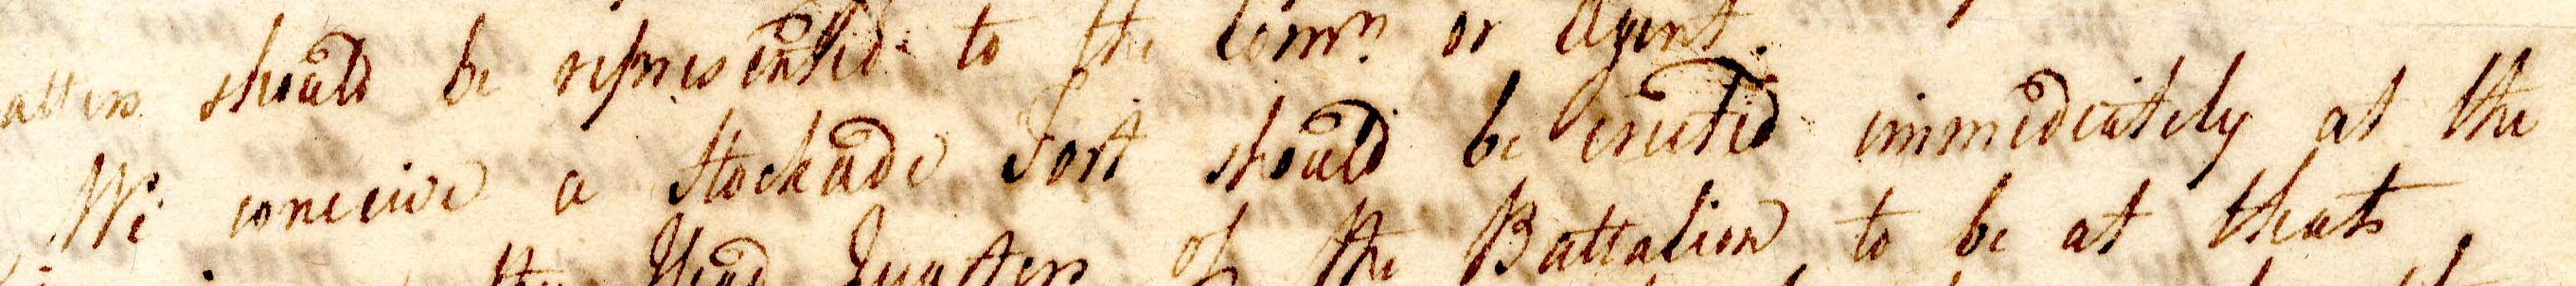We conceive a stockade fort should be erected immediately at the
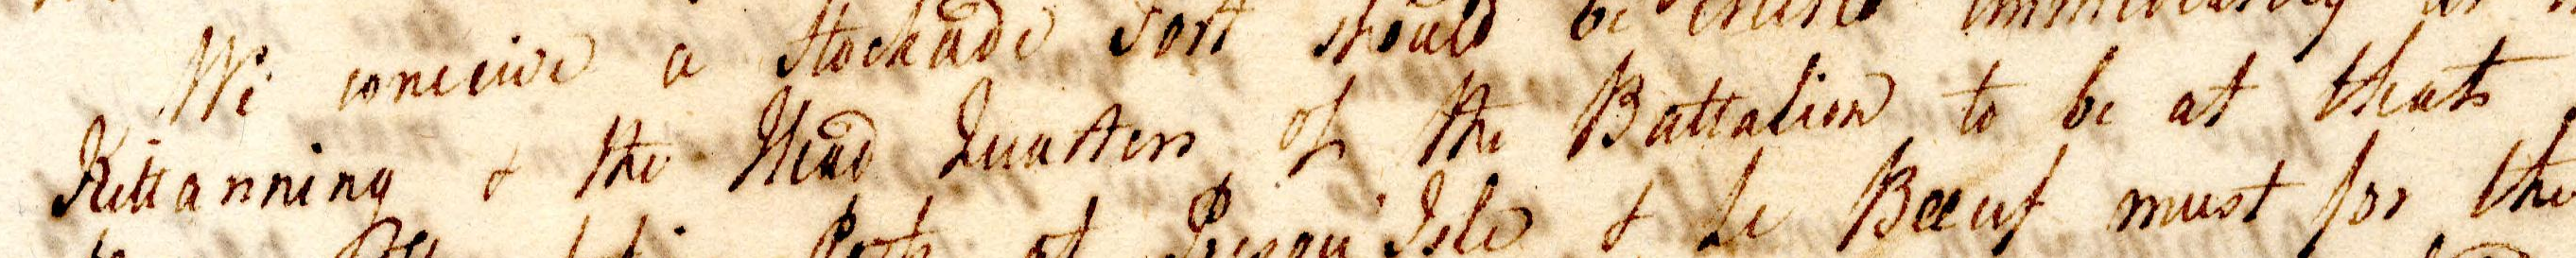Kittanning & the Head Quarters of the Battalion to be at that
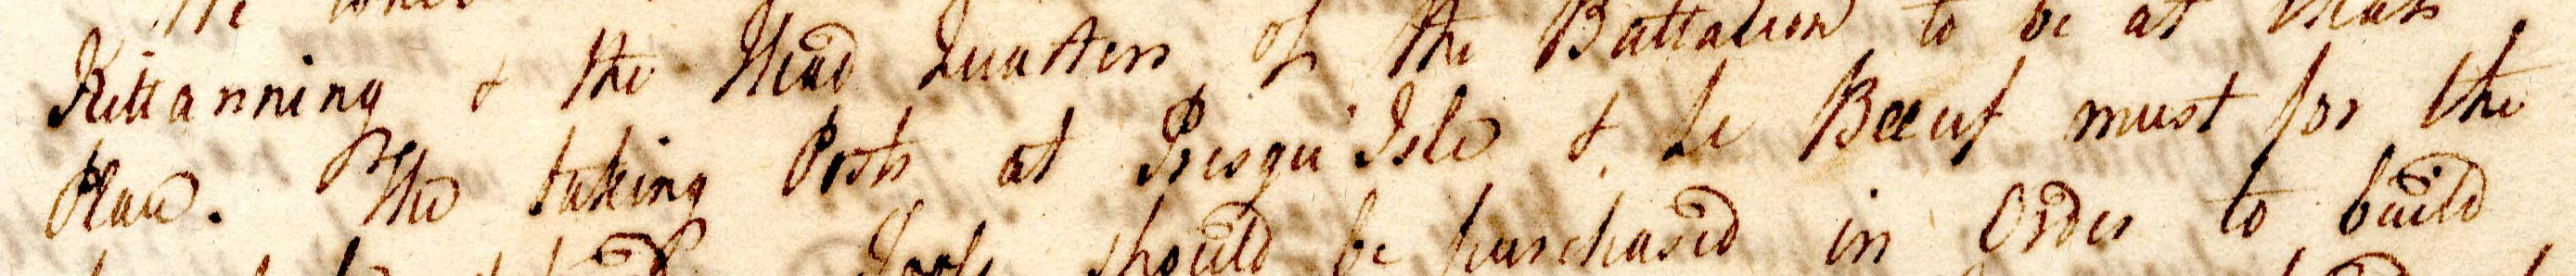Place. The trading Posts at Presqu' Isle & Le Boeuf must for the
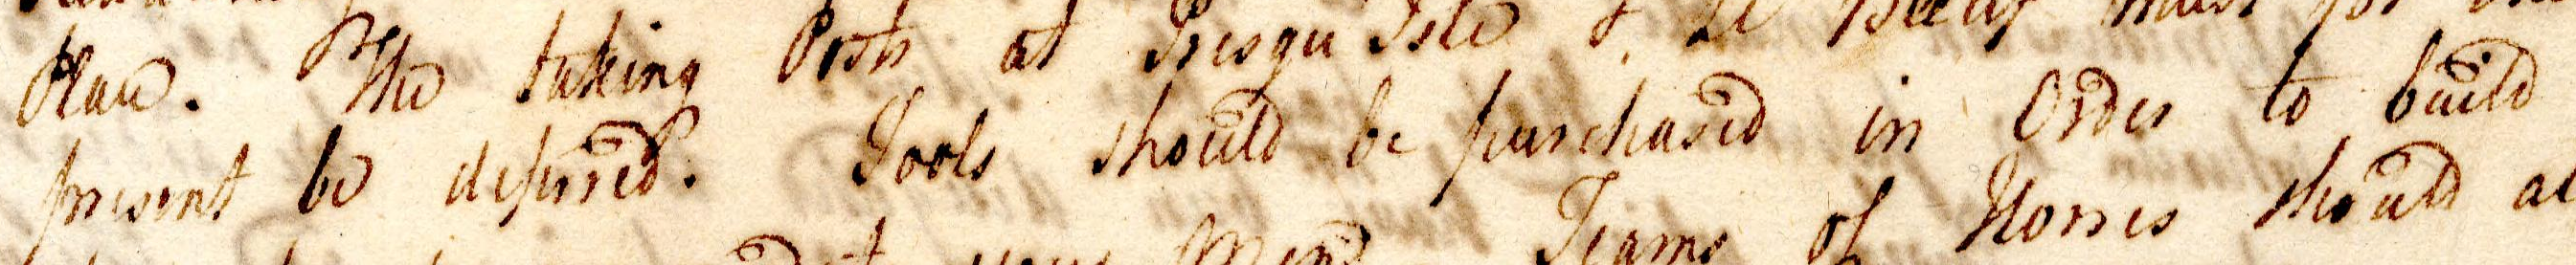present be defused. Tools should be purchased in Order to build
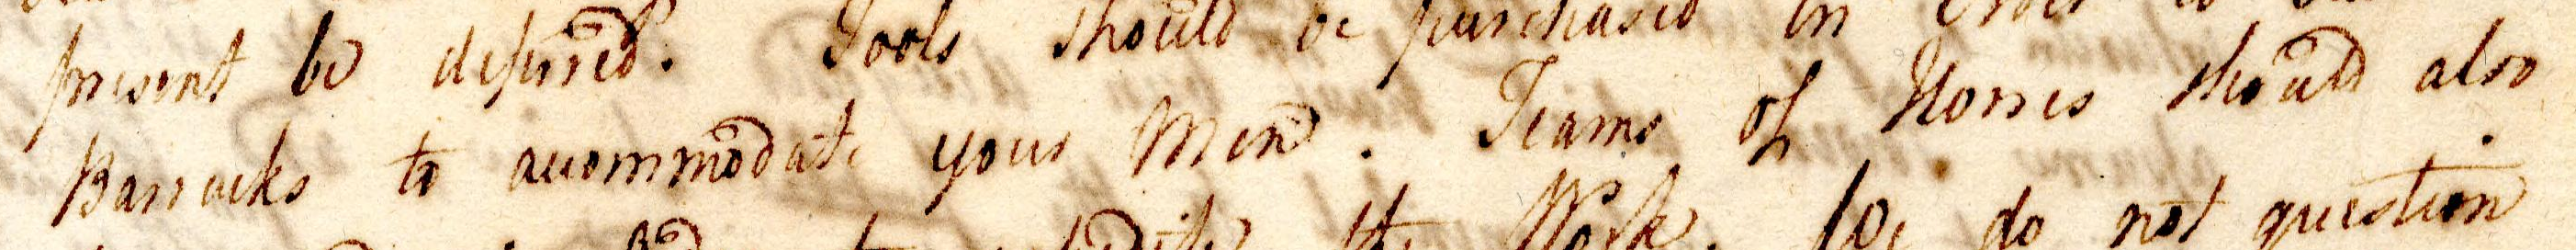Barracks to accommodate your Men. Teams of Horses should also
